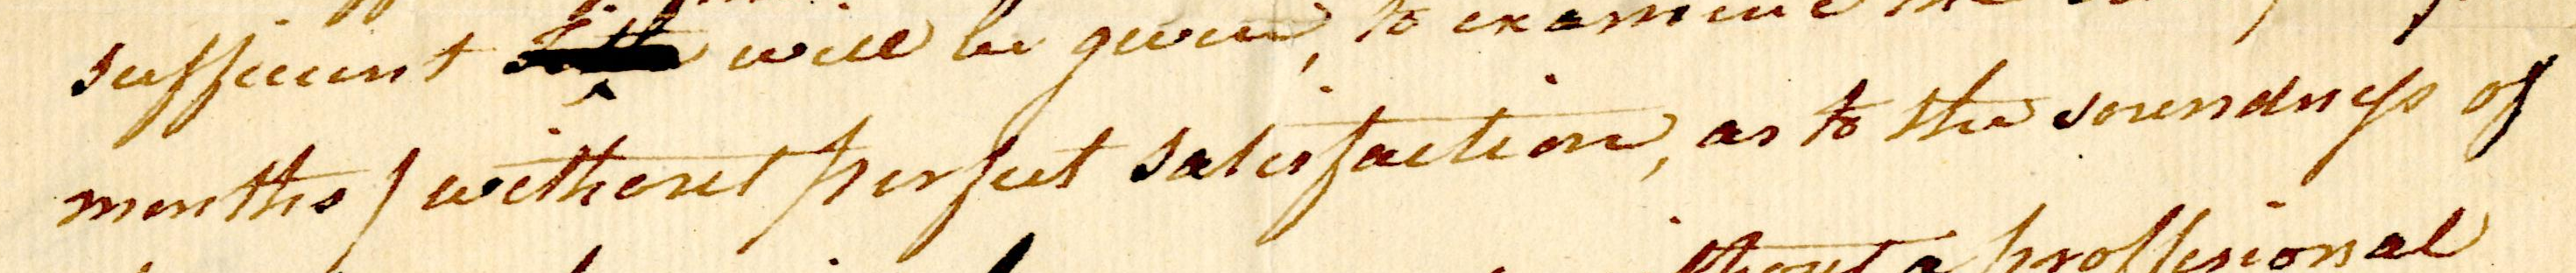months) without perfect satisfaction, as to the soundness of
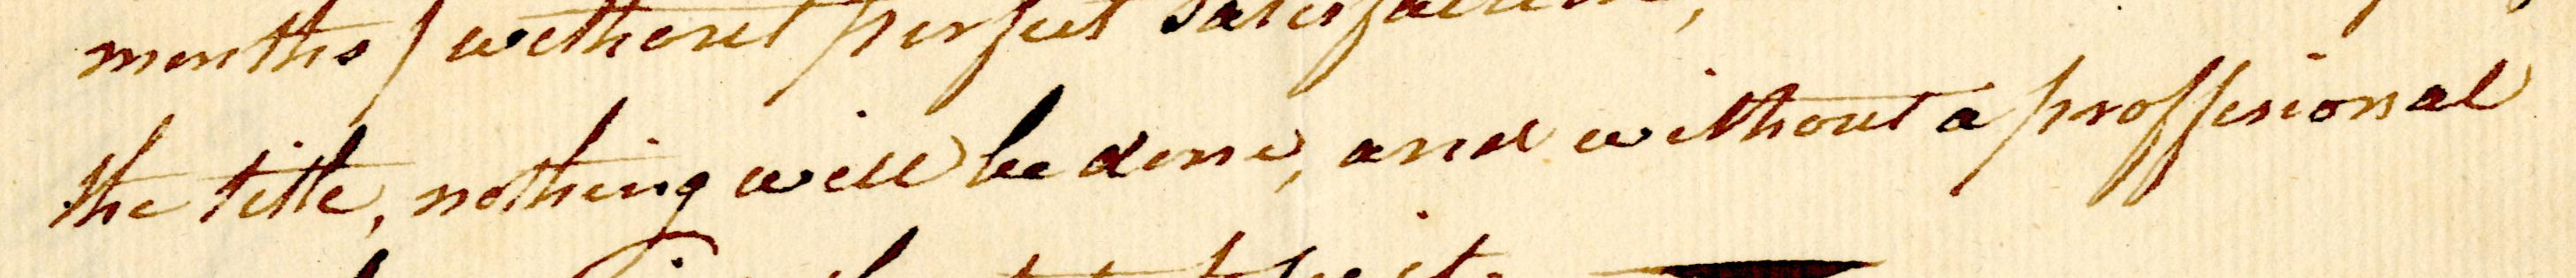the title, nothing will be done, and without a professional
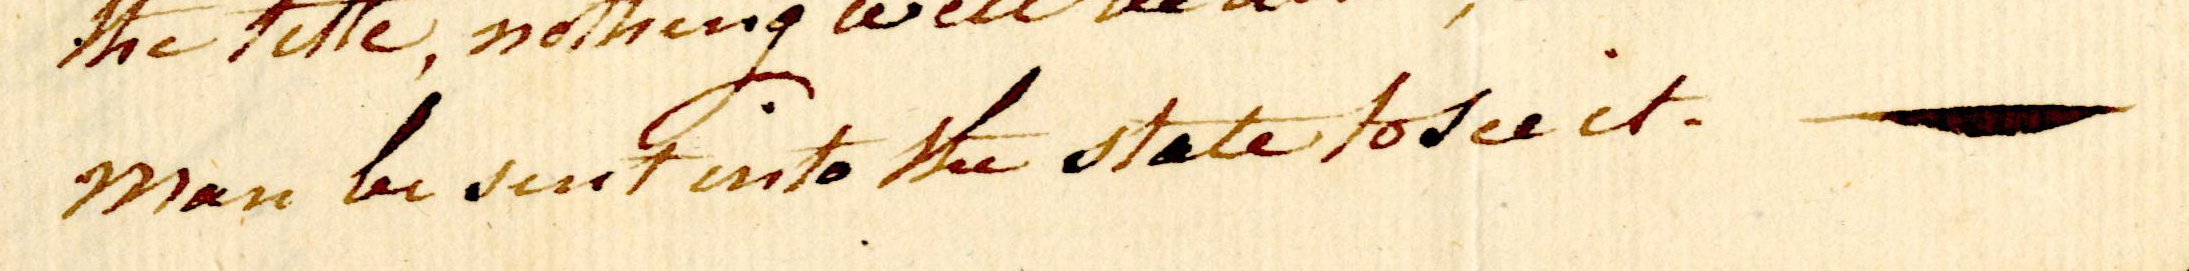Man be sent into the state to see it.-
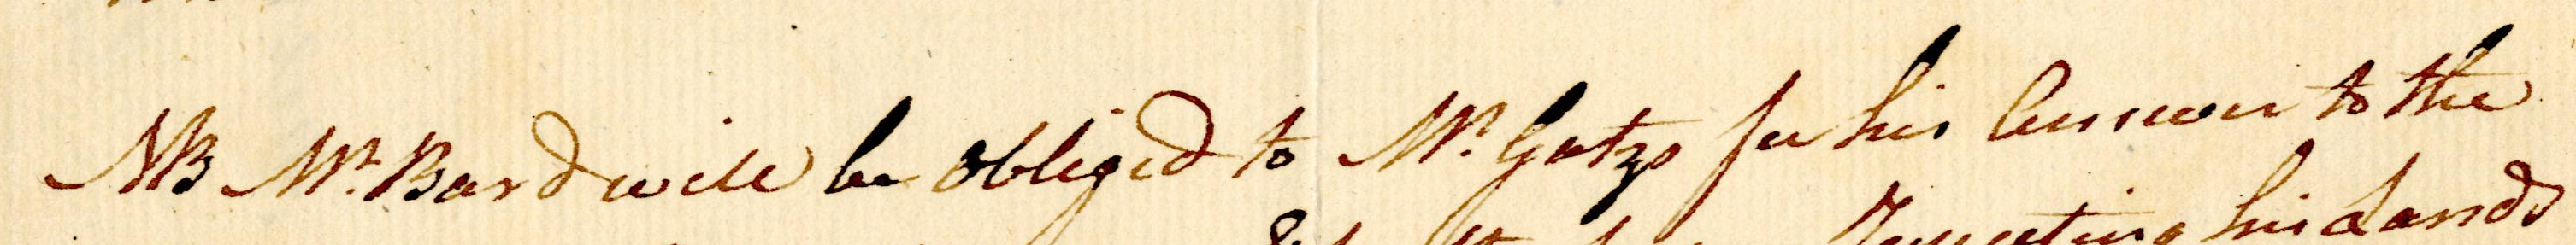NB M^r. Bard will be obliged to M^r. Gratz for his Answer to the
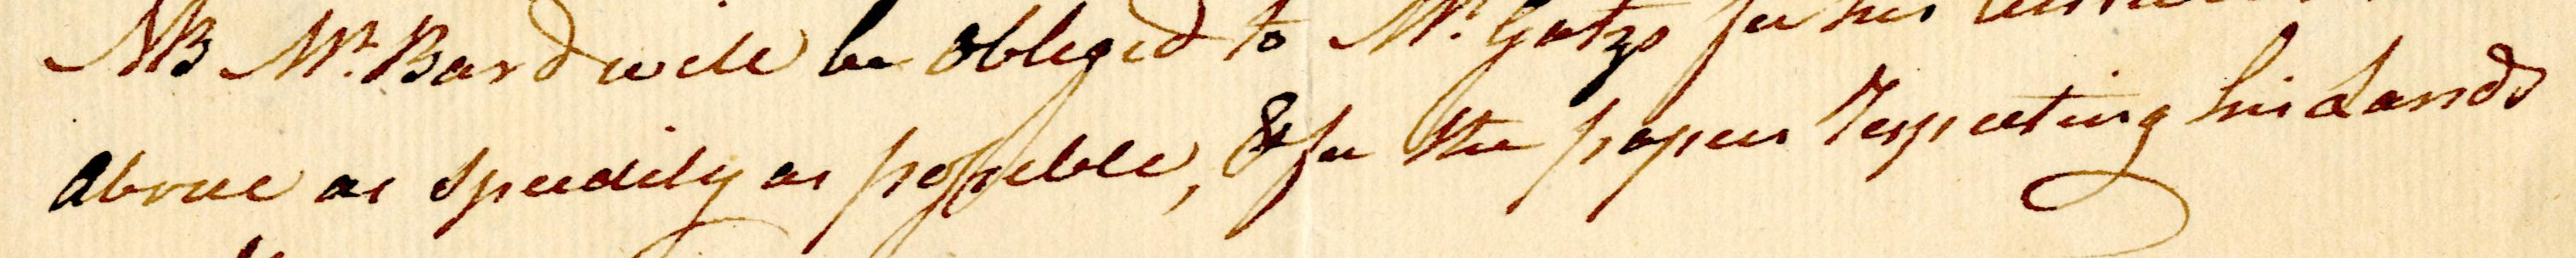Above as speedily as possible, & for the papers respecting his Lands
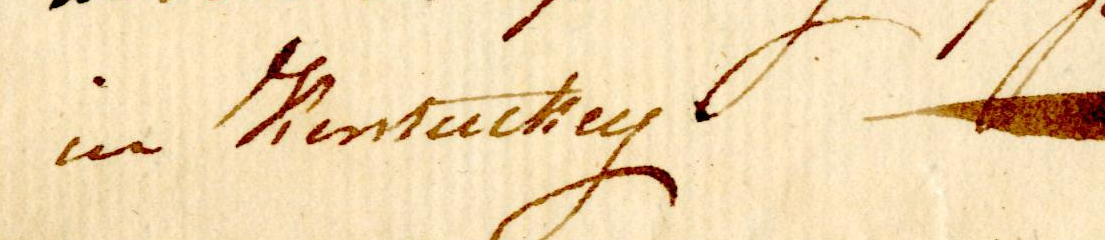in Kentuckey
